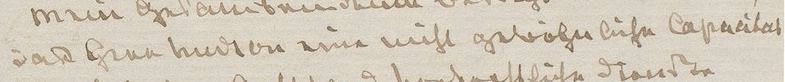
daß Herr Hudson eine nicht gewöhnliche Capacität
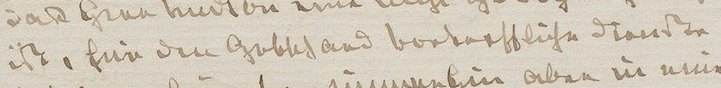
ist, für den Gotthard vortreffliche Dienste
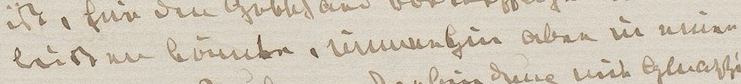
leisten könnte, immerhin aber in einer
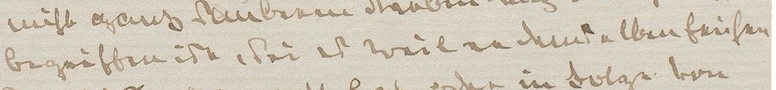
begriffen ist, sei es weil er demselben früher
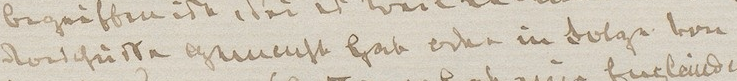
Vorschüsse gemacht hat oder in Folge von
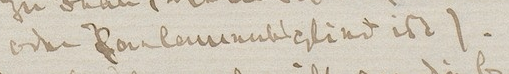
oder Parlamentsglied ist).
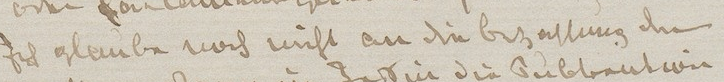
Ich glaube noch nicht an die Bezahlung der
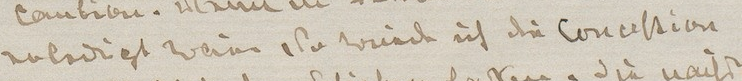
erledigt wäre, so würde ich die Concession
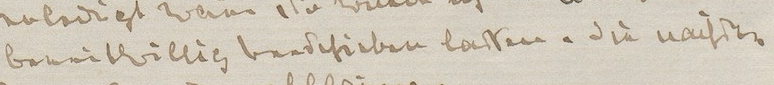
bereitwillig verschieben lassen. Die nächsten
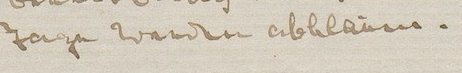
Tage werden abklären.
